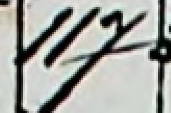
117
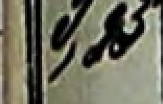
9,25
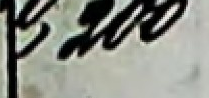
0,200
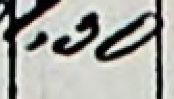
1,30
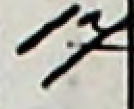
17
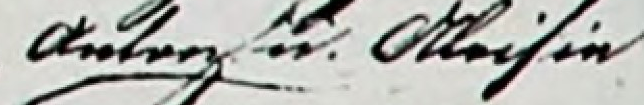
Anton u. Aloisia
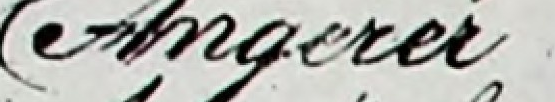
Angerer
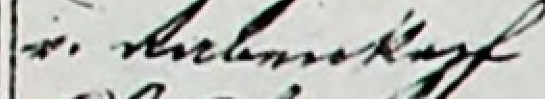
v. Rabenkopf
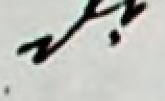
Do
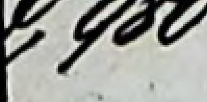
0,980
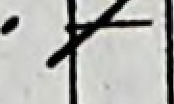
7
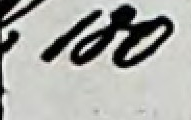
0,180
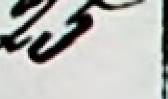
25
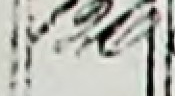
126
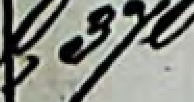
0,370
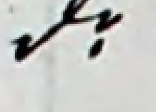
Do
